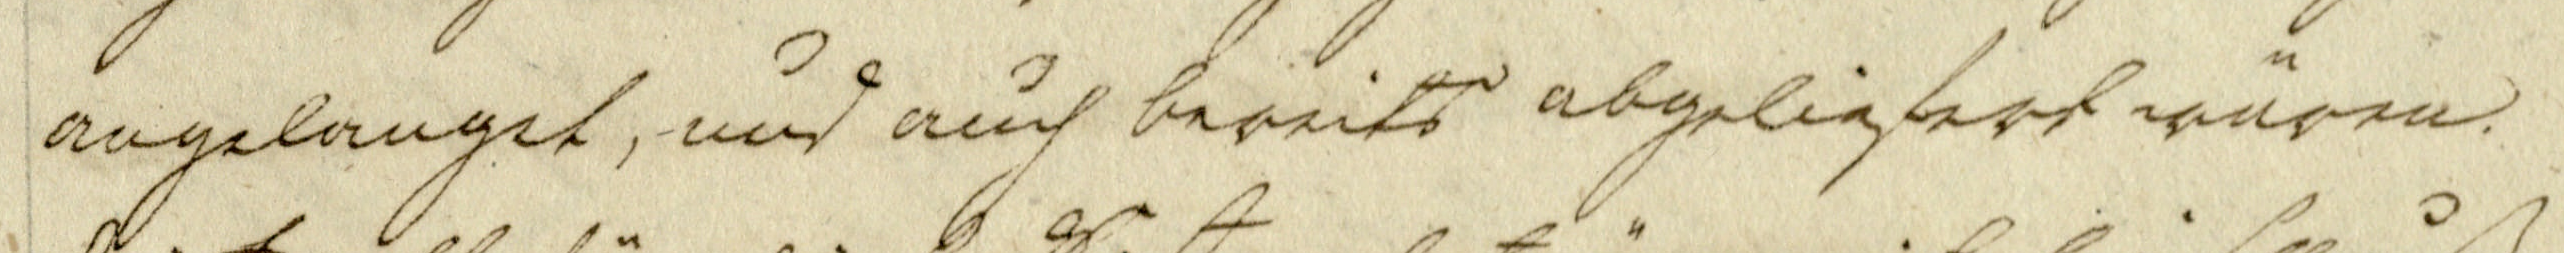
angelanget, und auch bereits abgeliefert wären.
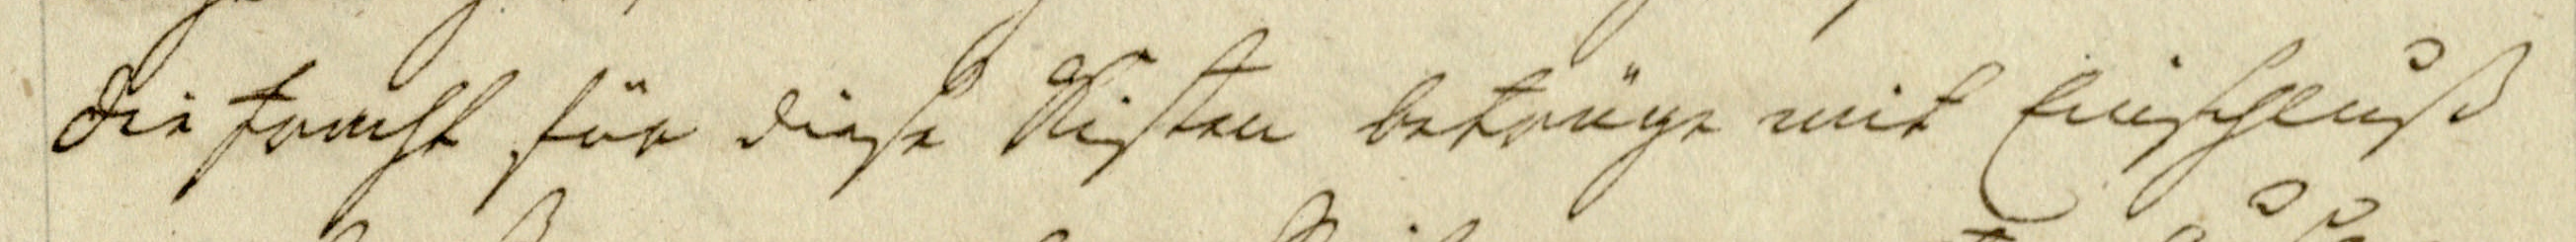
Die Fracht für diese Kisten betrüge mit Einschluß
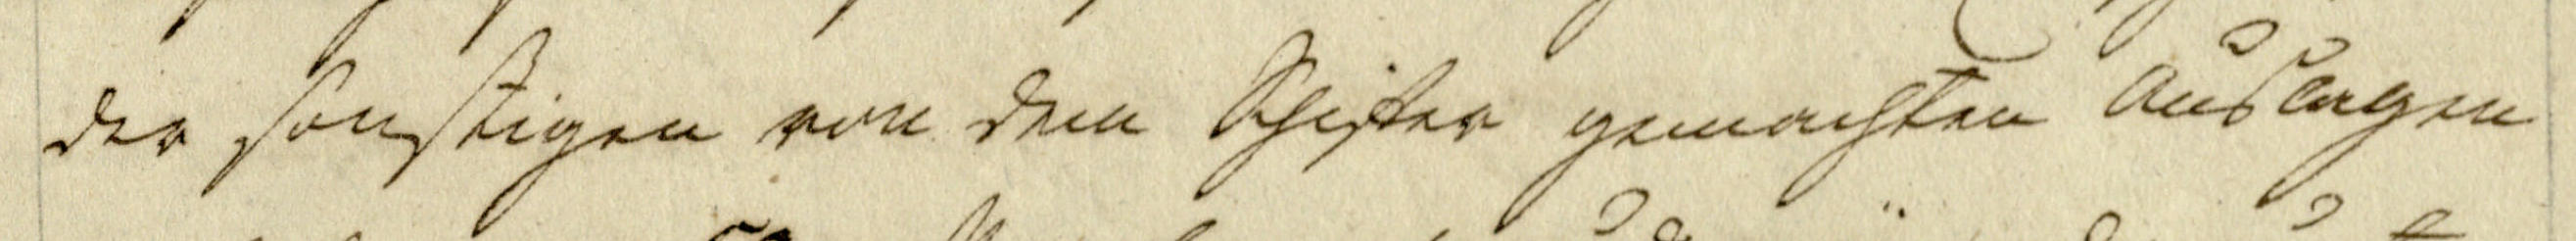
der sonstigen von dem Schifer gemachten Auslagen
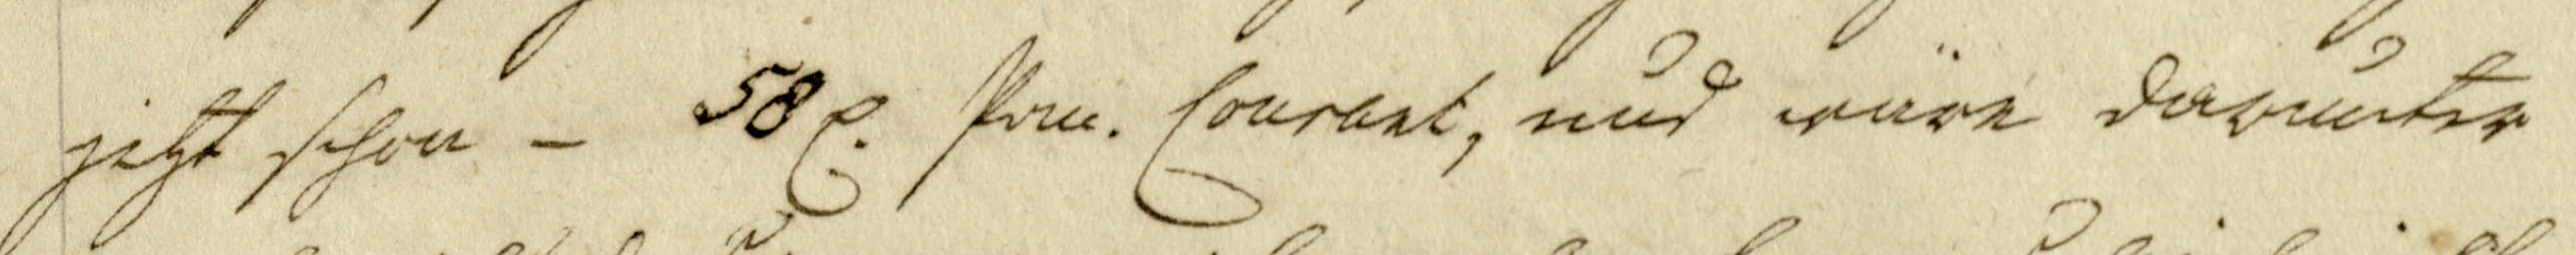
jetzt schon 58 l. Pom Courant, und wäre darunter
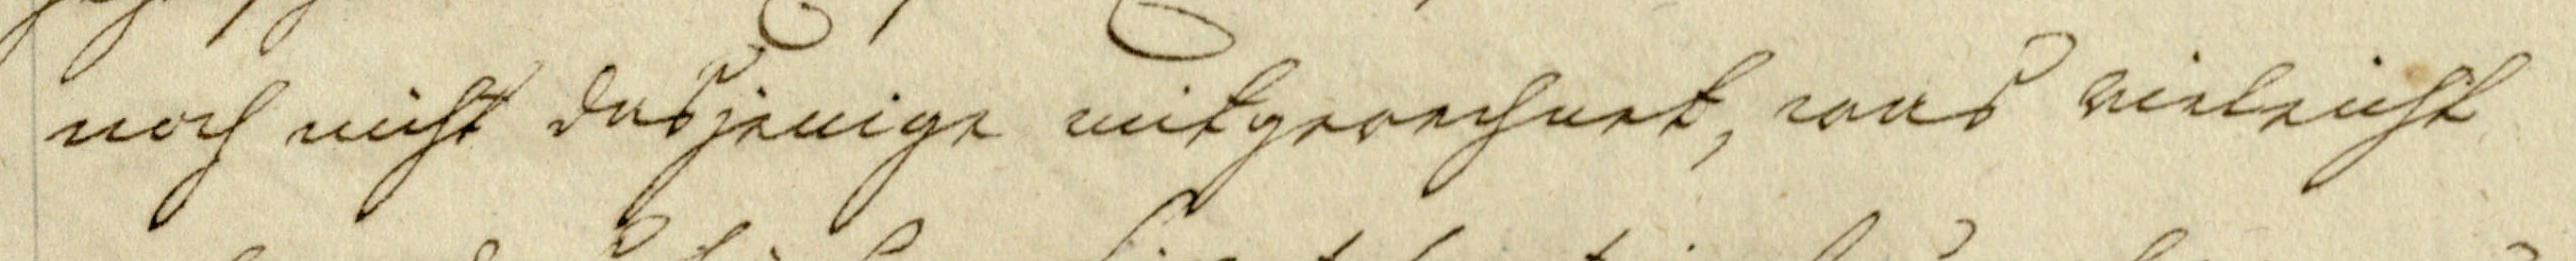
noch nicht dasjenige mitgerechnet, was vieleicht
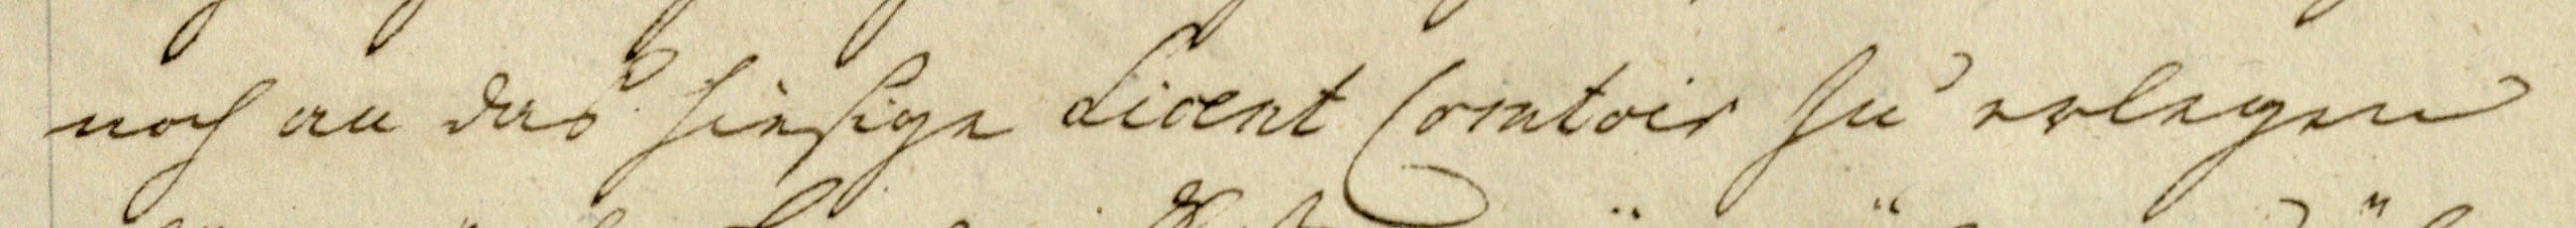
noch an das hiesige Licent Comtoir zu erlegen
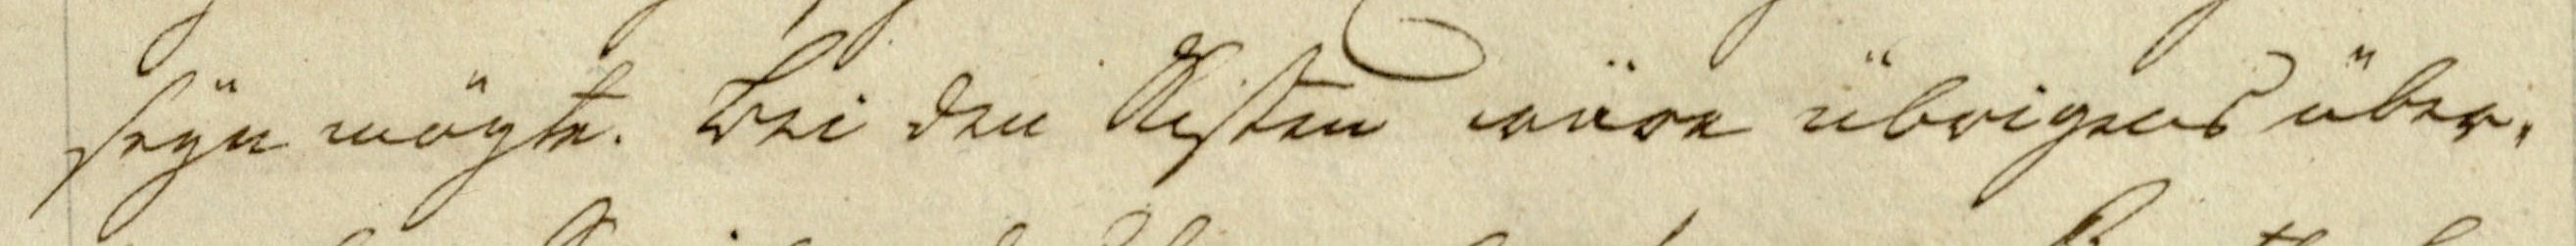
seÿn mögte. Bei den Kisten wäre übrigens über¬
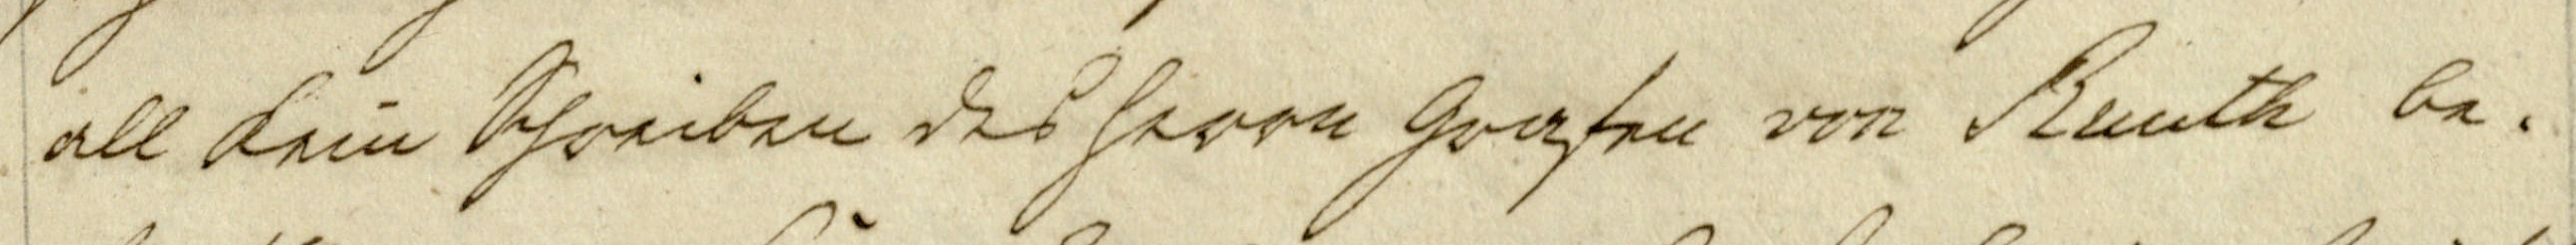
all kein Schreiben des herrn Grafen von Ruuth be¬
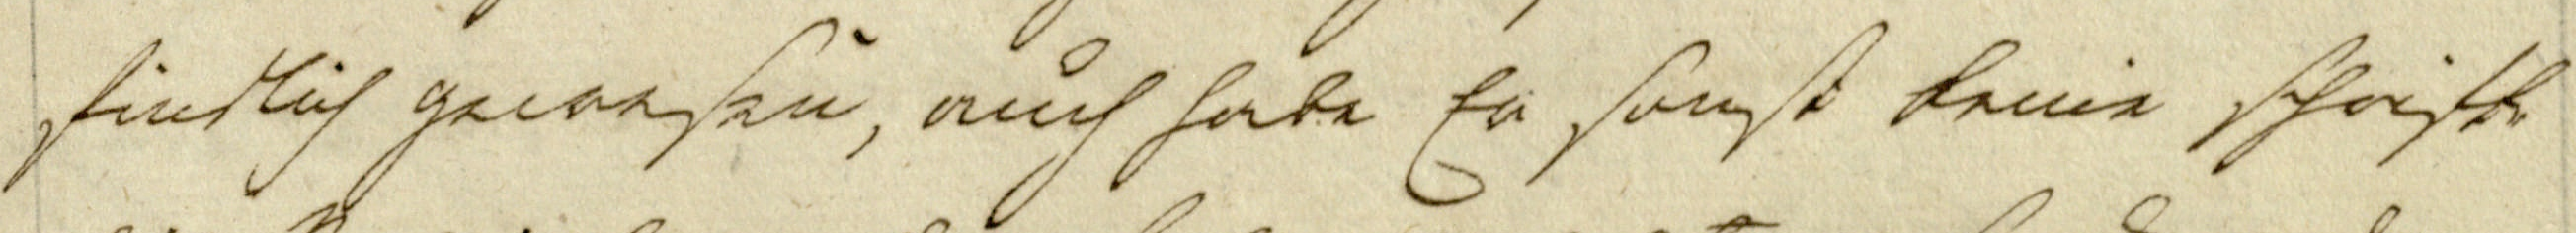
findlich gewesen, auch habe Er sonst keine schrift¬
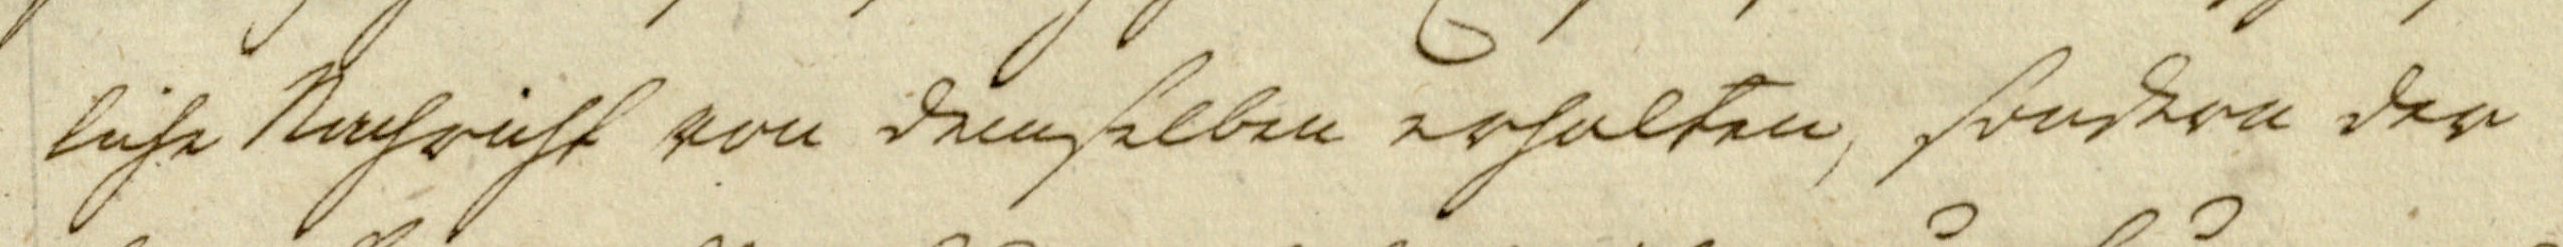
liche Nachricht von demselben erhalten, sondern der
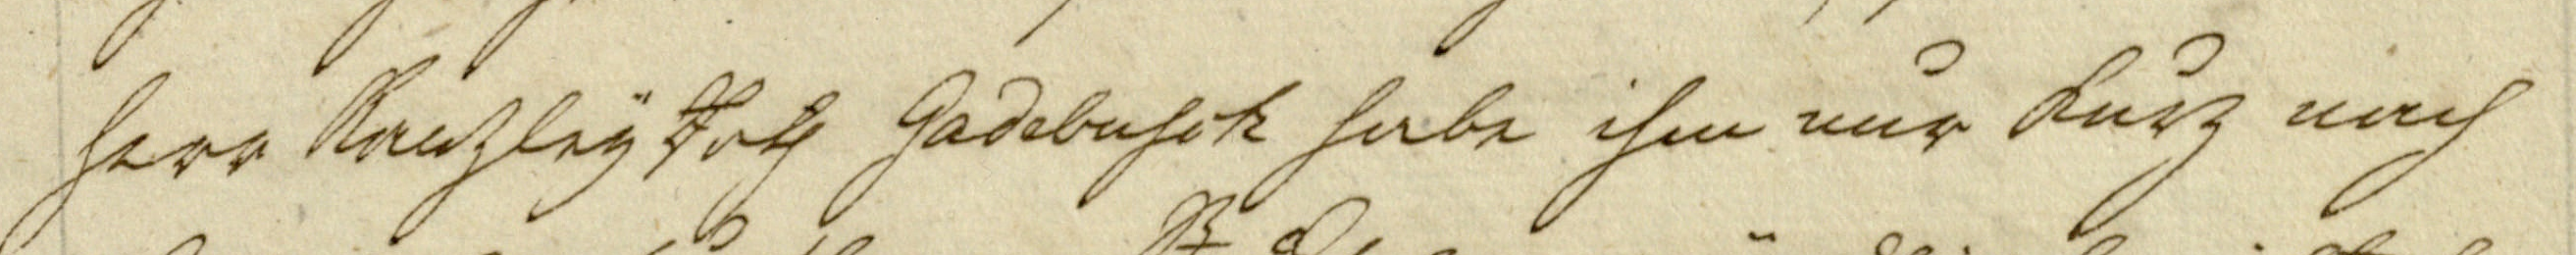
herr Kanzleÿ Rath Gadebusch habe ihm nur kurz nach
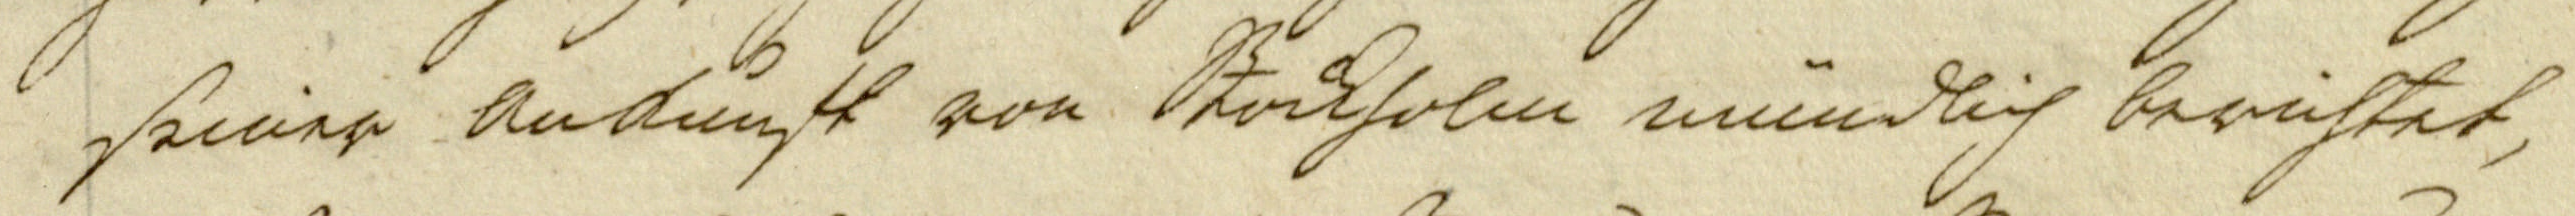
seiner Ankunft von Stockholm mündlich berichtet,
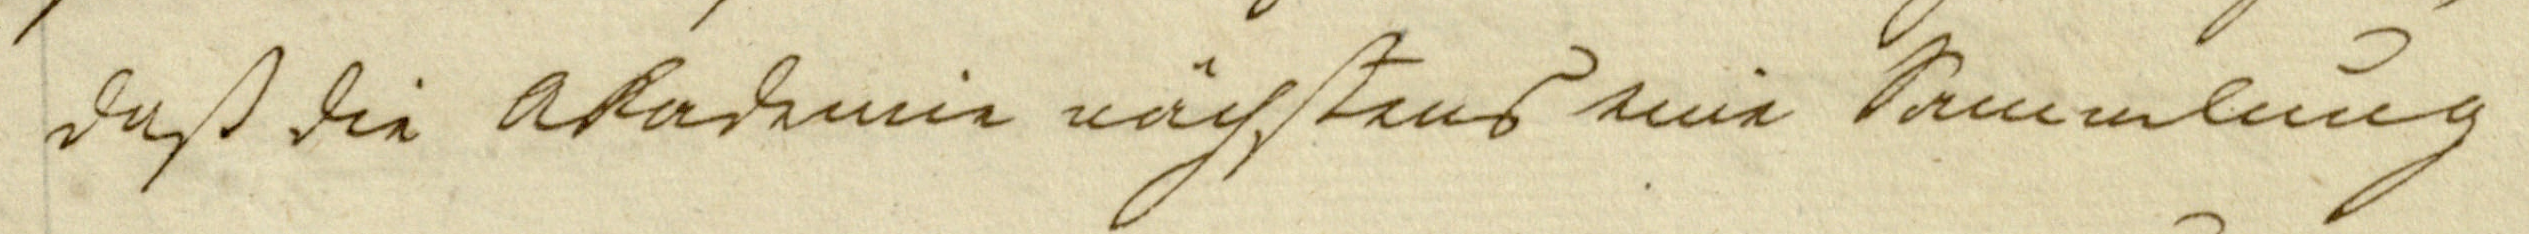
daß die Akademie nächstens eine Sammlung
